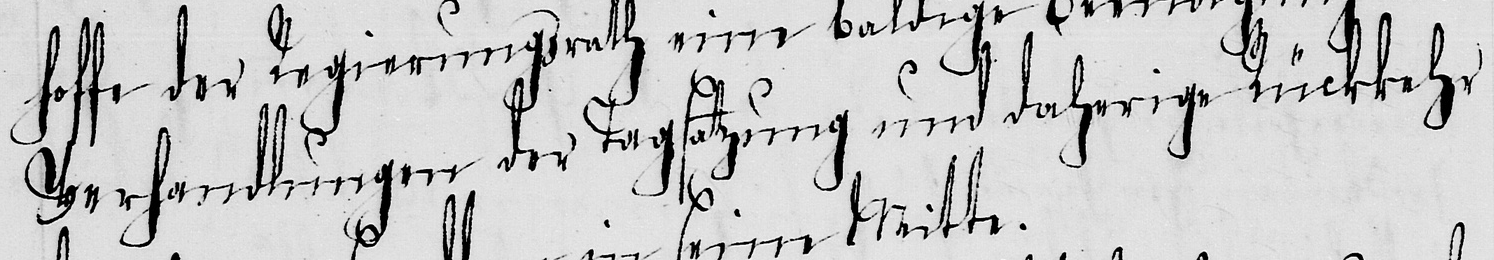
Verhandlungen der Tagsatzung und daherige Rückkehr
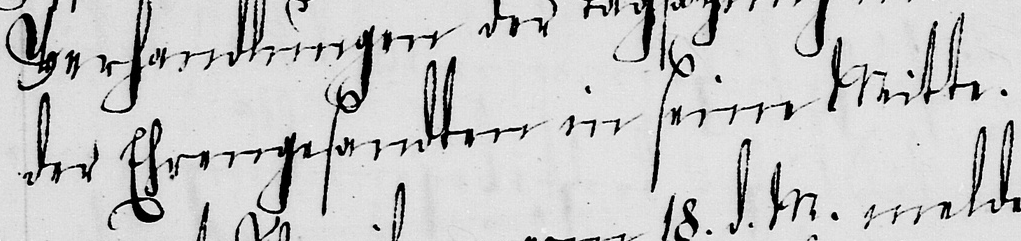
der Ehrengesandten in seine Mitte.
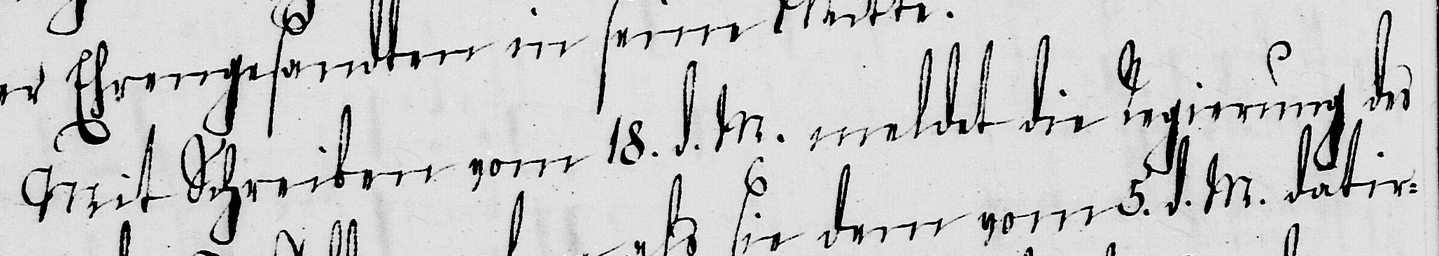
Mit Schreiben vom 18. d. M. meldet die Regierung des
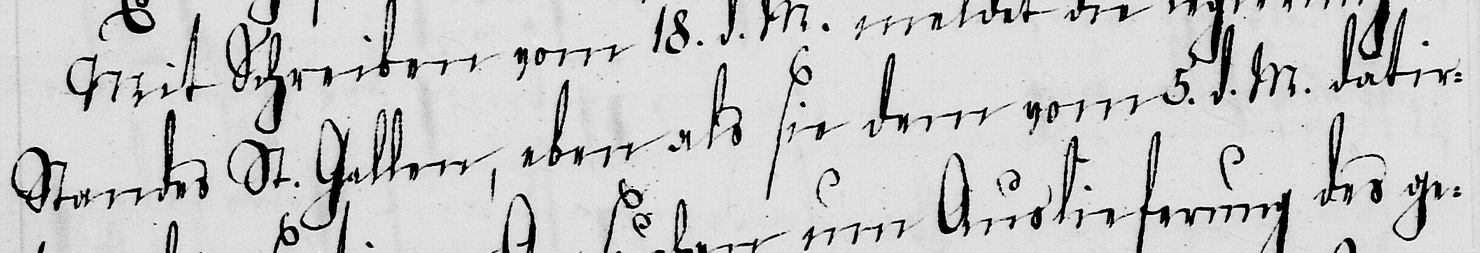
Standes St. Gallen, eben als sie dem vom 5. d. M. datir¬
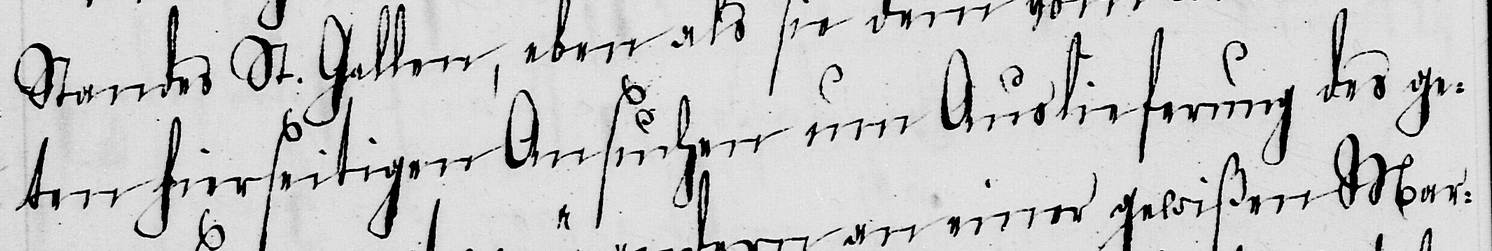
ten hierseitigen Ansuchen um Auslieferung des ge¬
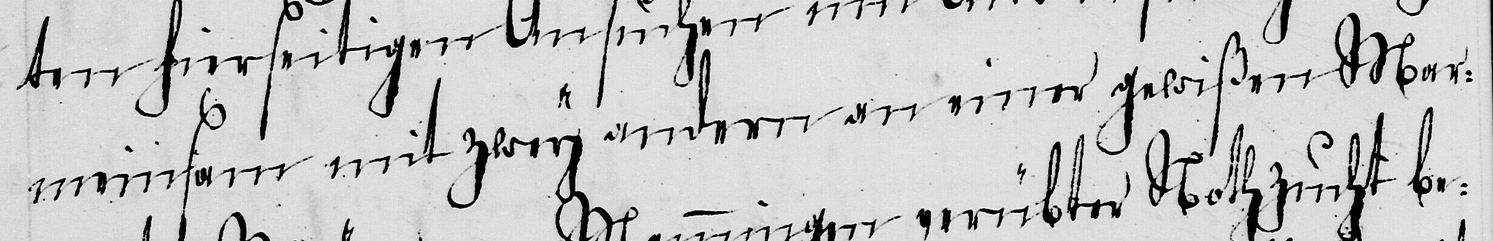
meinsam mit zwey andern an einer gewißen Mar¬
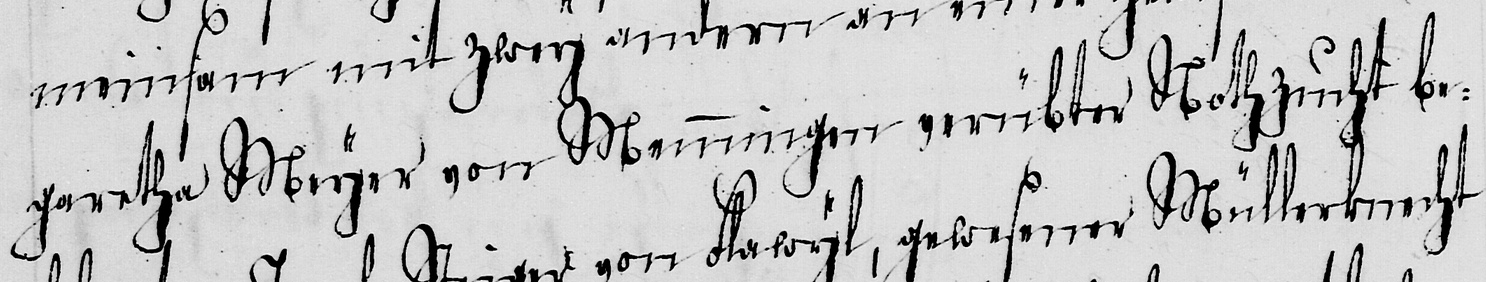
garetha Meyer von Menningen verübter Nothzucht be¬
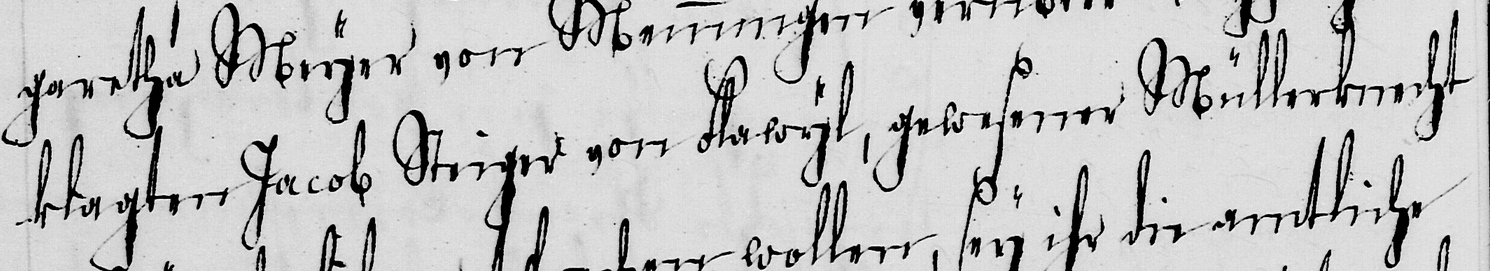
klagten Jacob Steiger von Flawyl, gewesener Müllerknecht
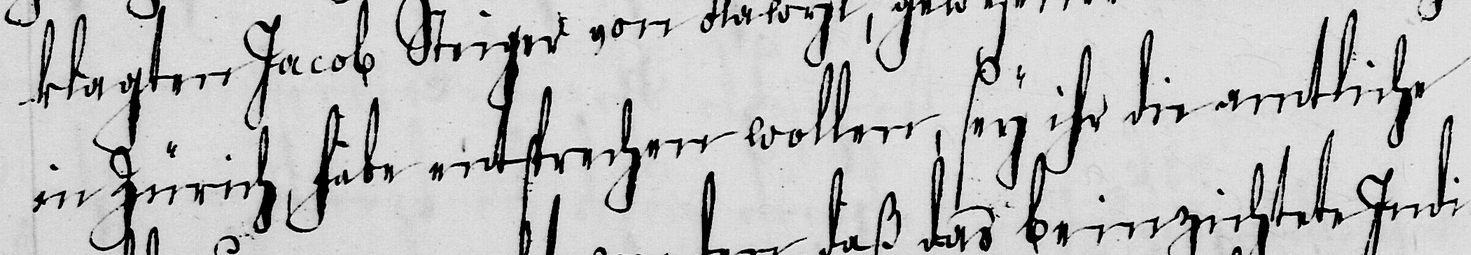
in Zürich, habe entsprechen wollen, sey ihr die amtliche
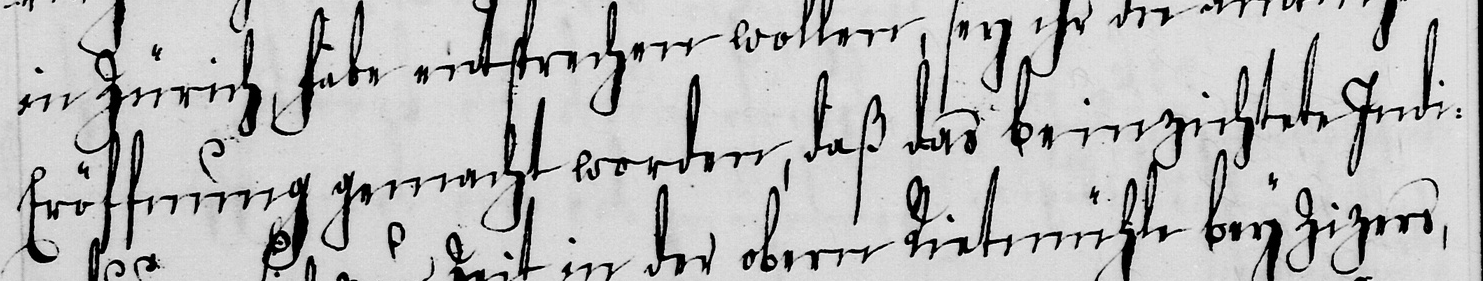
Eröffnung gemacht worden, daß das beinzichtete Indi¬
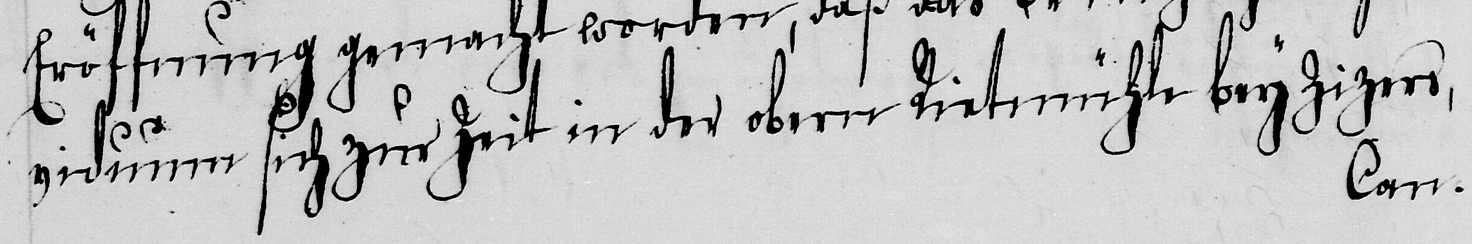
viduum sich zur Zeit in der obern Rietmühle bey Zizers,
